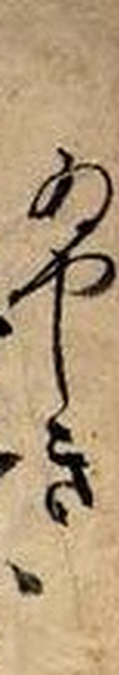ゐやしき
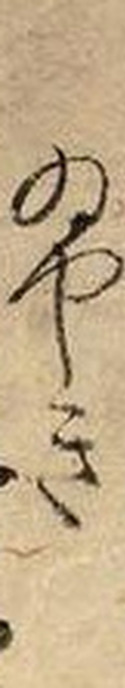ゐやしき
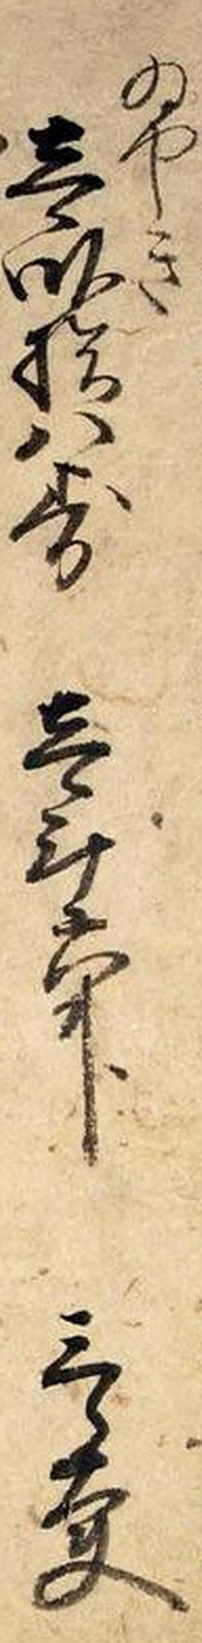壱畝拾八歩壱斗六升三郎大郎
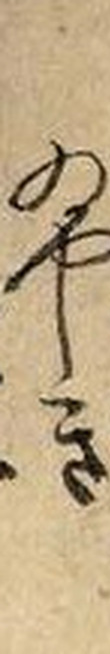ゐやしき
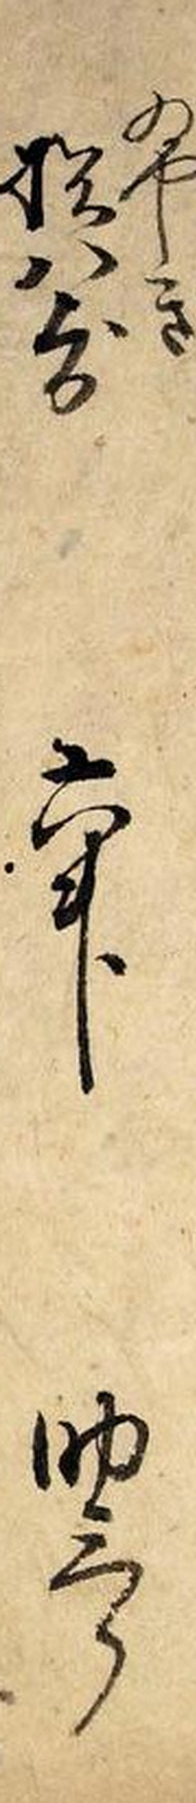拾八歩六升助三郎
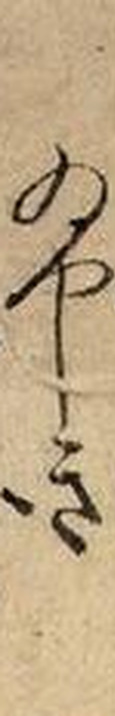ゐやしき
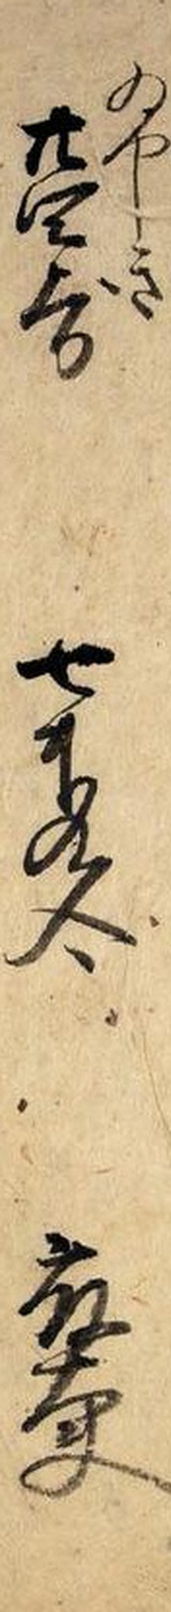廿四歩七升九合藤大夫
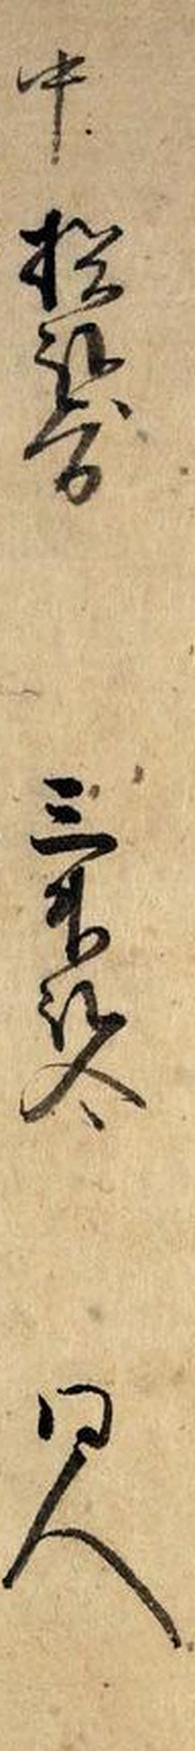中拾弐歩三升弐合同人
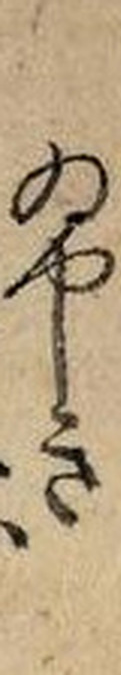ゐやしき
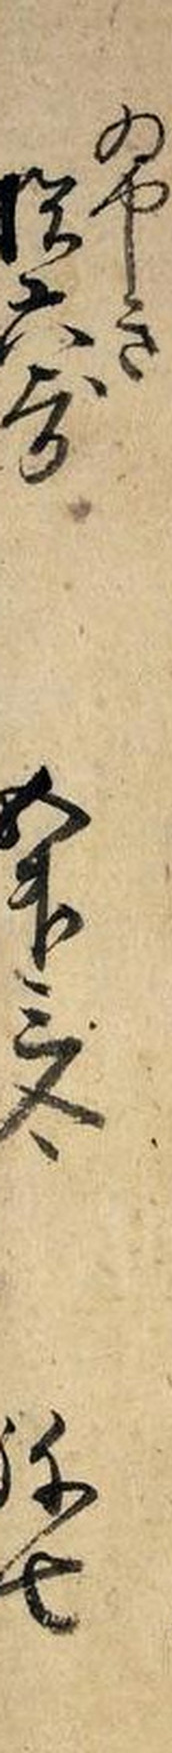拾六歩五升三合弥七
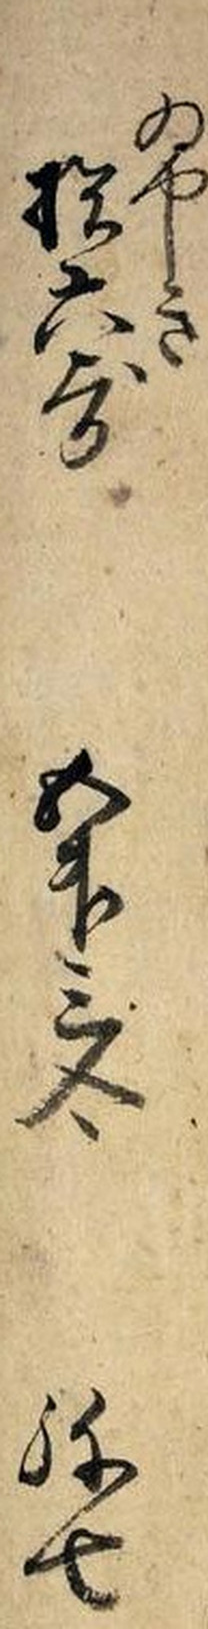拾六歩五升三合弥七
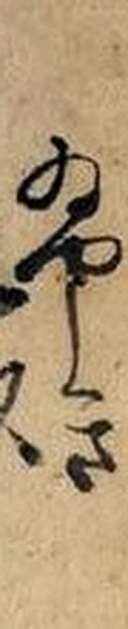ゐやしき
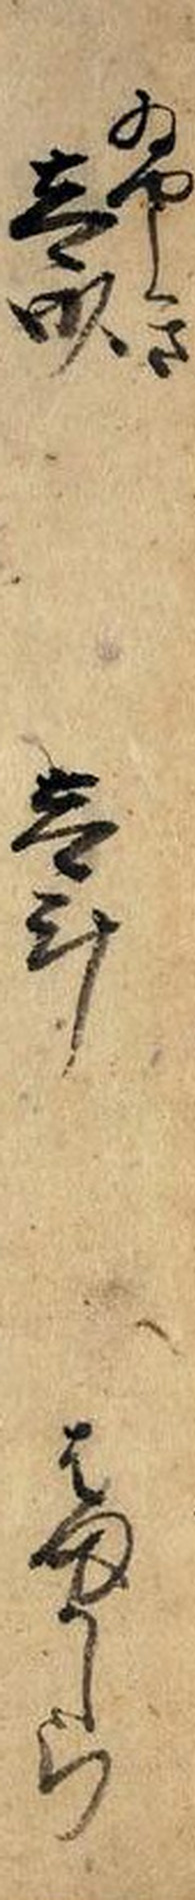壱畝壱斗はまかしら
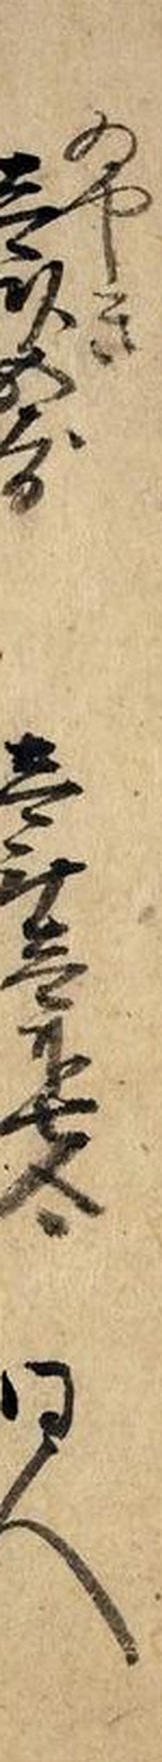壱畝五歩壱斗壱升七合同人
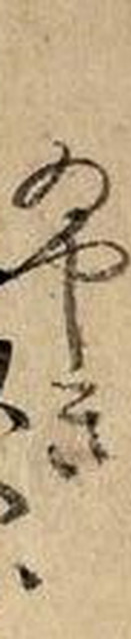ゐやしき
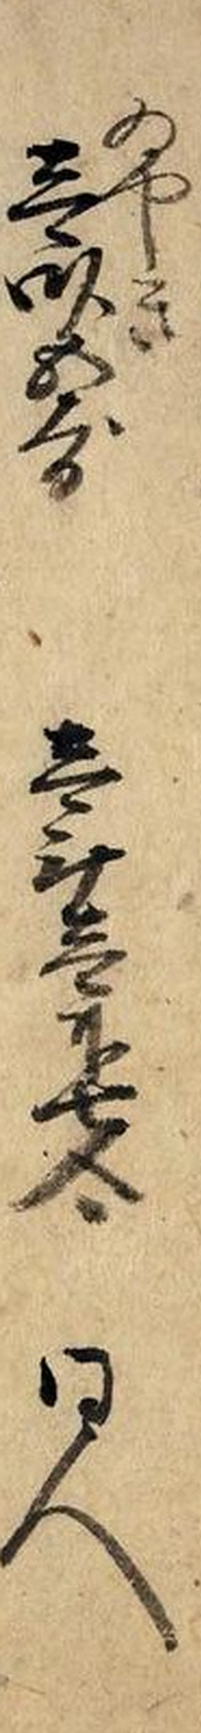壱畝五歩壱斗壱升七合同人
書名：若州三方郡之内世久見浦御検地帳（世久見浦検地帳写）
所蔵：福井県文書館 Fukui Prefectural Archives
